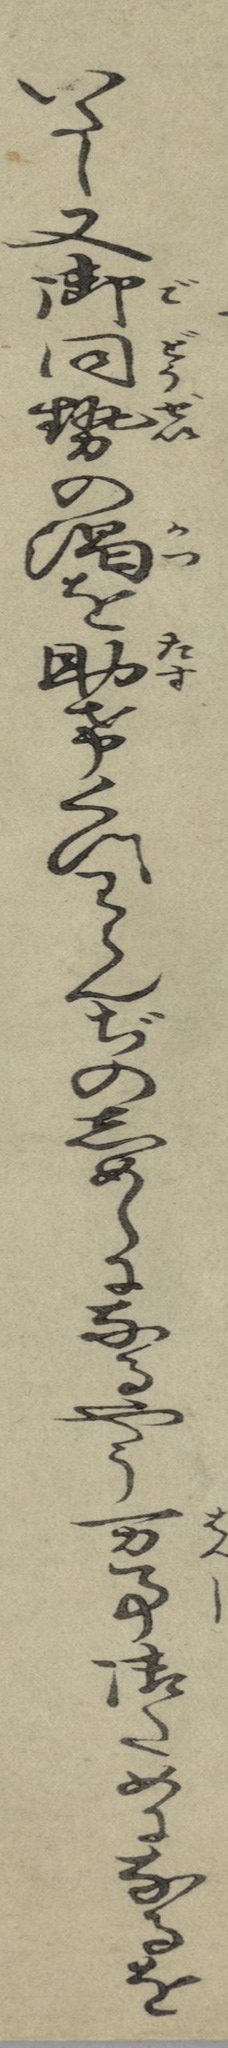いたし又御同勢の渇を助けくつわらんぢのしめしになるやう万事御ためになるを
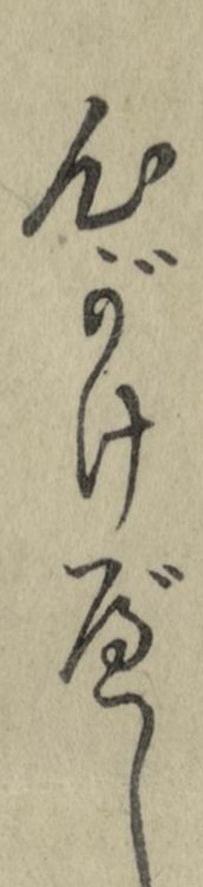心がけべし
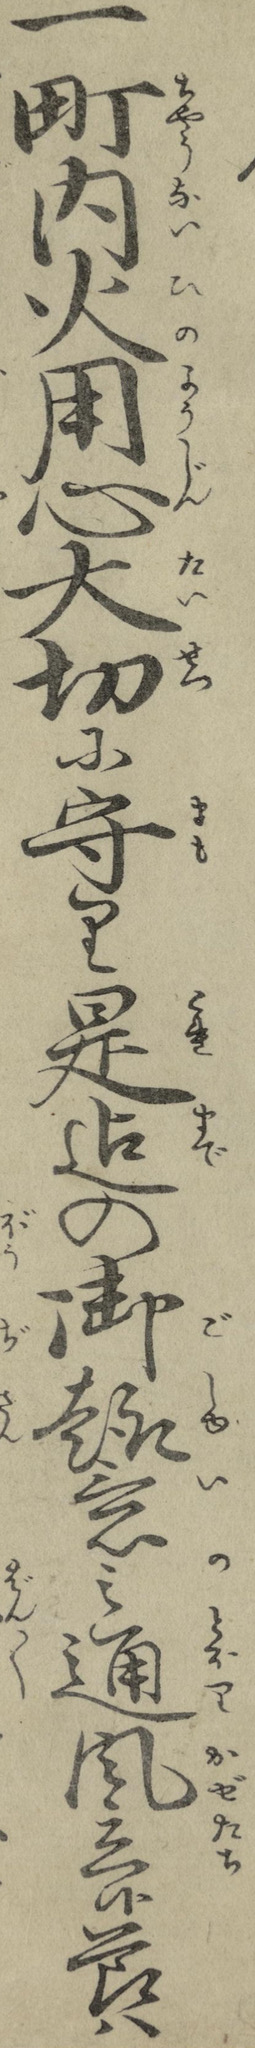一町内火用心大切に守り是迄の御趣意之通風立候節は
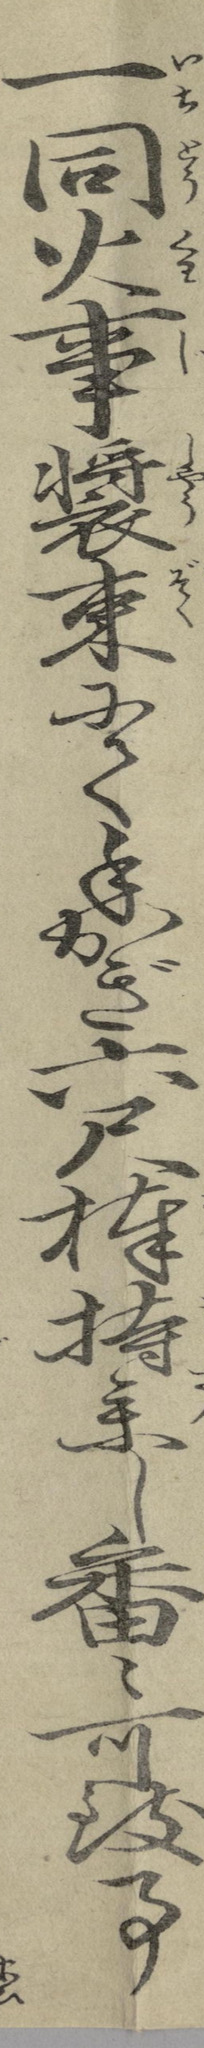一同火事装束にて手かぎ六尺棒持参し番〻可致事
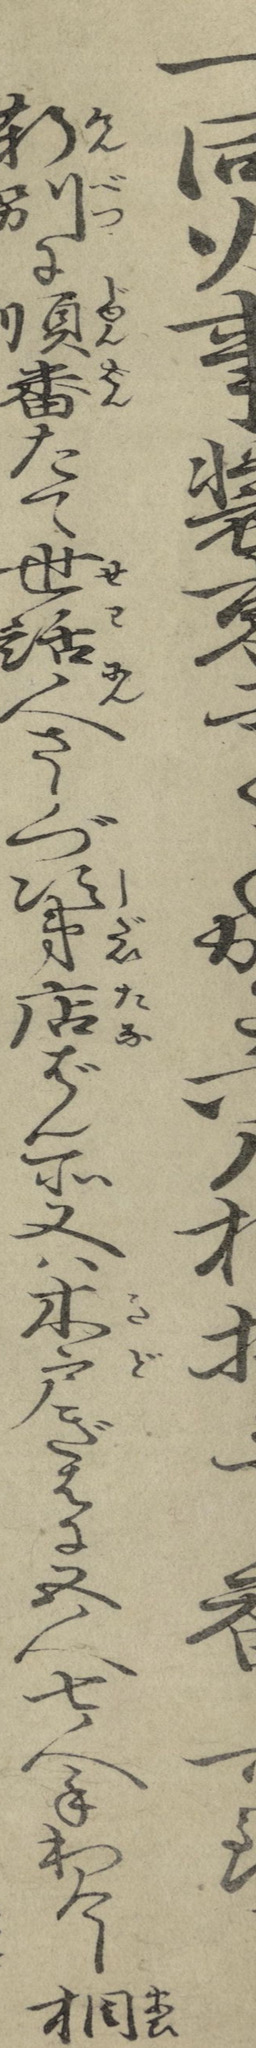軒別に順番たて世話人さしづ次第店ばん所又は木戸ぎはに五人七人手わけし相
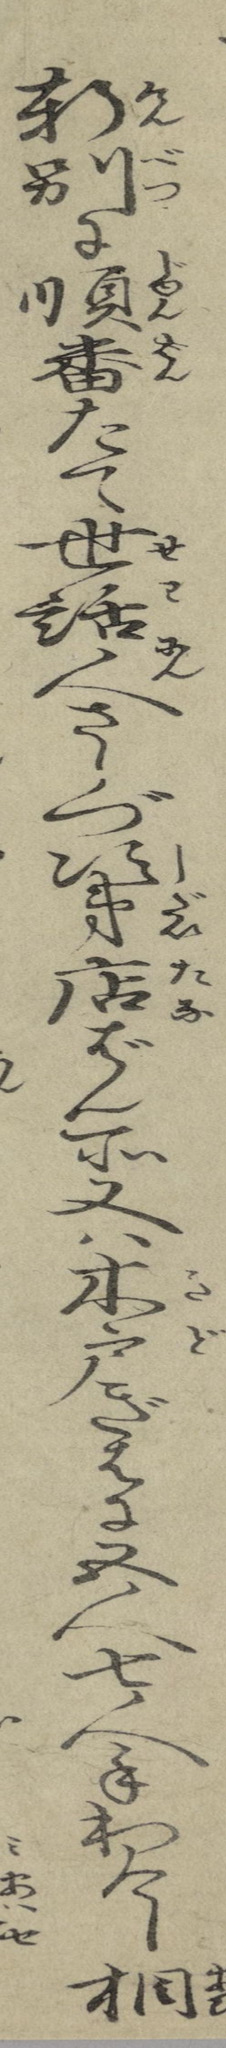軒別に順番たて世話人さしづ次第店ばん所又は木戸ぎはに五人七人手わけし相
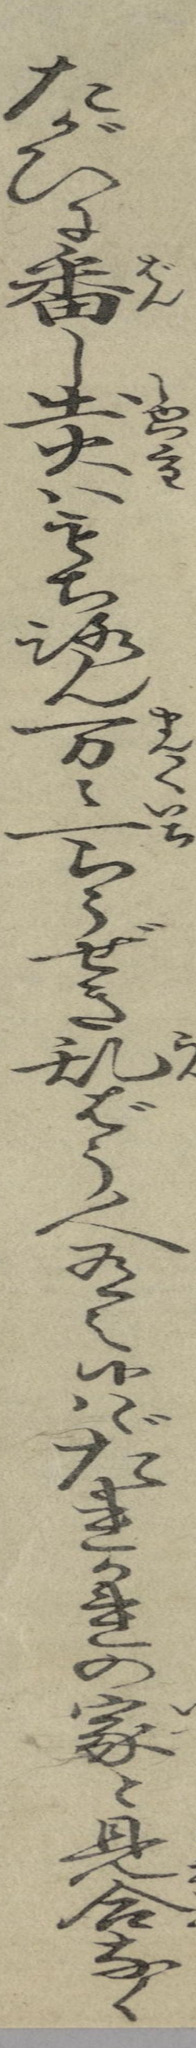たがひに番し出火はもちろん万〻一らうぜき乱ばう人有之候はゞたれかれの家と見合なく
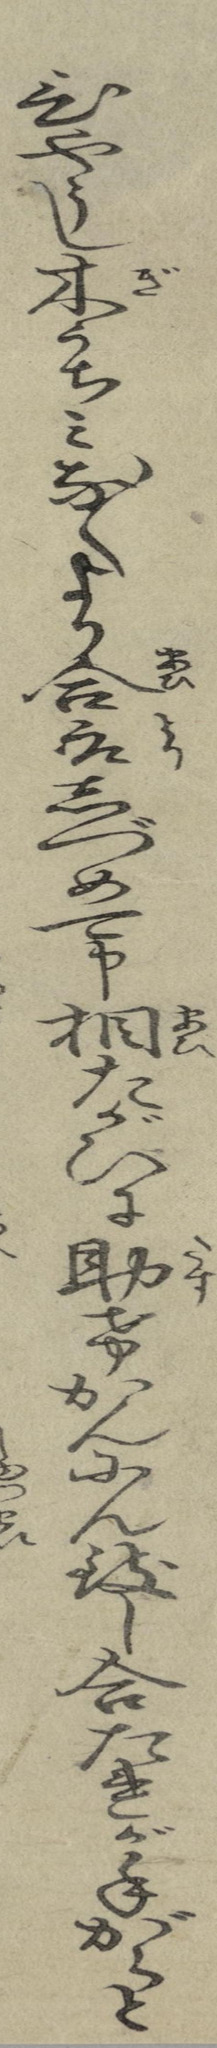ひやうし木うちみな〳〵より合取しづめ可申相たがひに助けかんにん致し合たれが手がらと
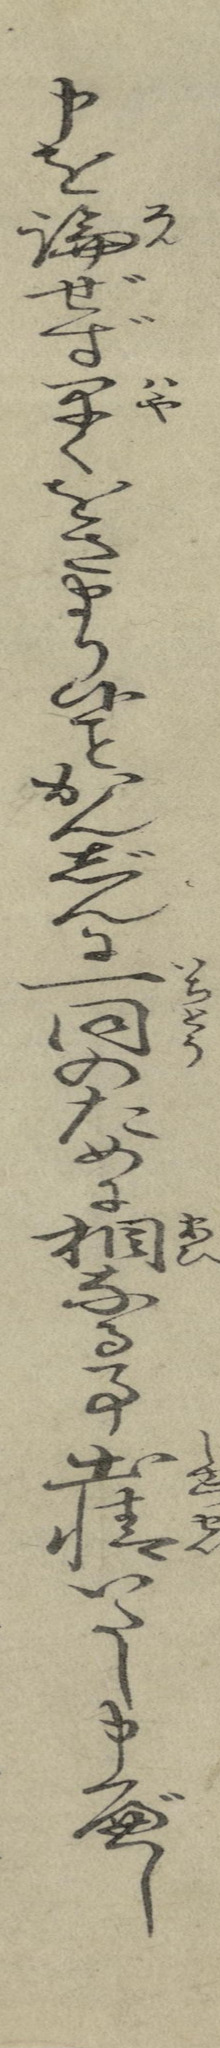申を論ぜず早くをさまり候をことかんじんに一同のために相なる事出情いたし申べし
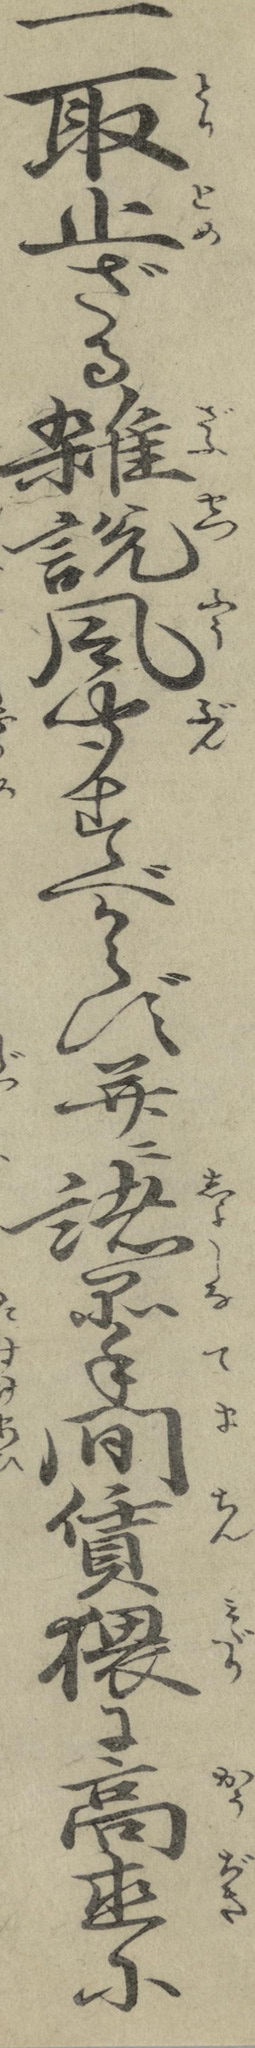一取止ざる雑節風聞すべからず幷に諸品手間賃猥に高直に
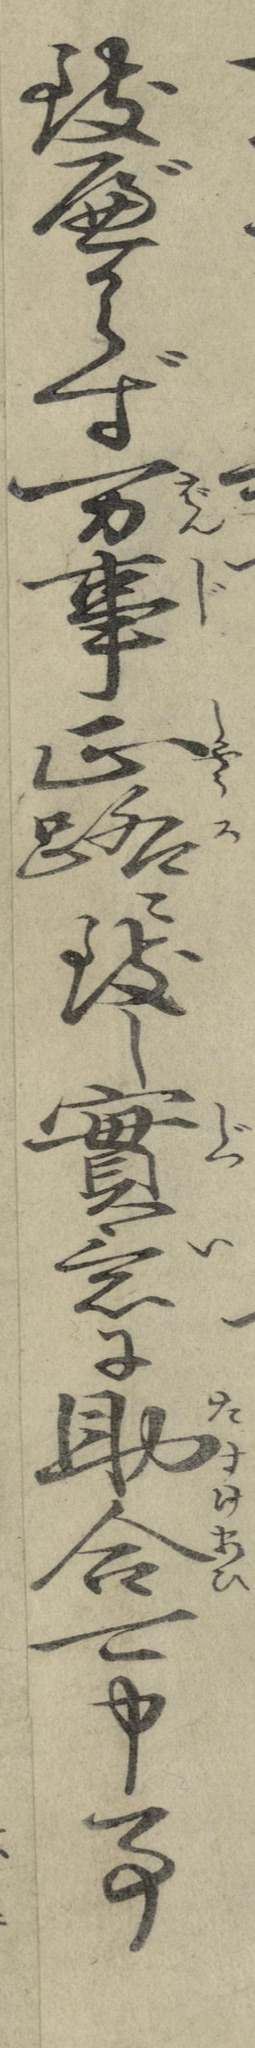致べからず万事正路に致し実意に助合可申事
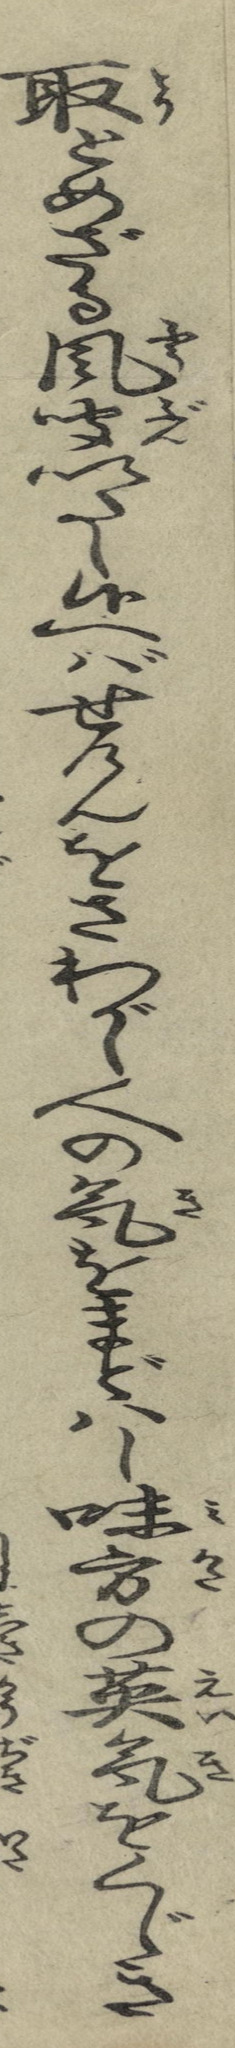取とめざる風聞いたし候へばせけんをさわがし人の気をまどはし味方の英気をくじき
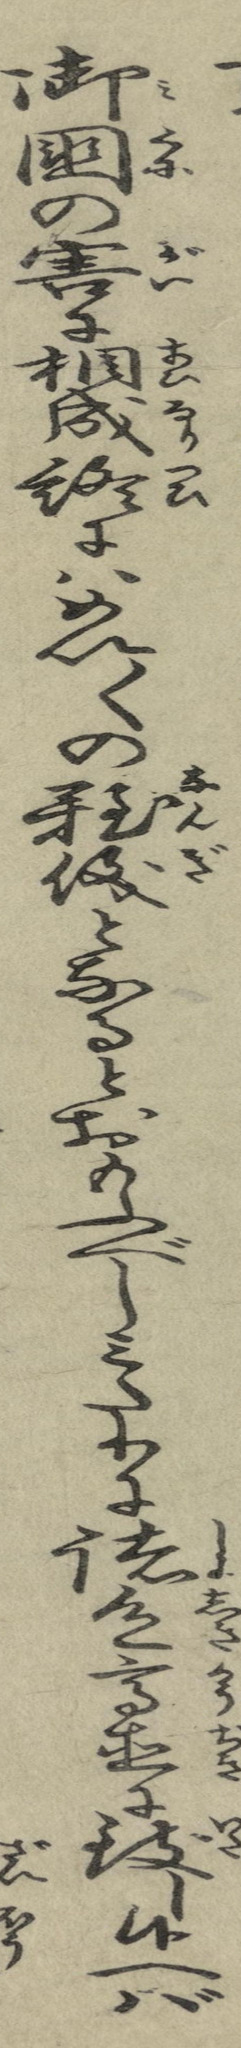御国の害に相成終にはめい〳〵の難儀となるとおもふべしみたりに諸色高直致し候へば
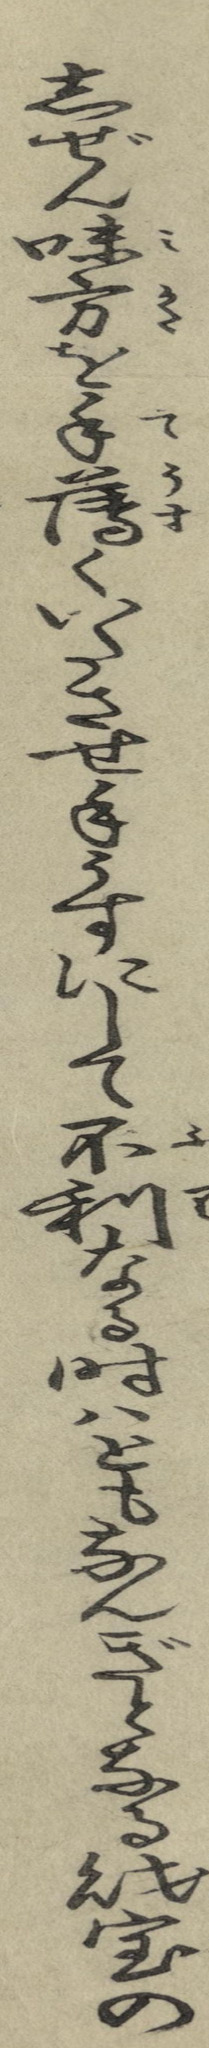しぜん味方を手薄くいたさせ手うすにして不利なる時はともなんぎとなる財宝の
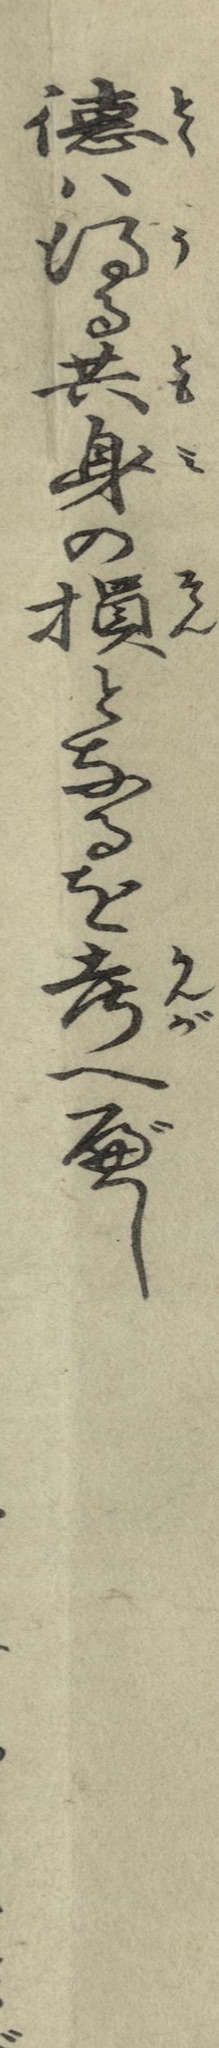徳は得る共身の損となるを考へべし
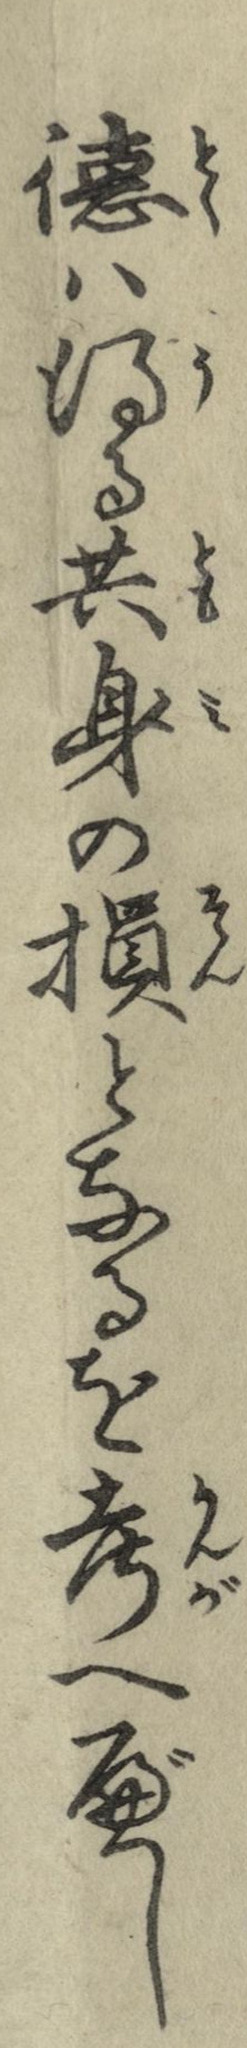徳は得る共身の損となるを考へべし
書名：火の元用心肝要之事・諸人安全心得の事
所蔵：東京大学地震研究所図書室 Earthquake Research Institute Library, The University of Tokyo, JAPAN
